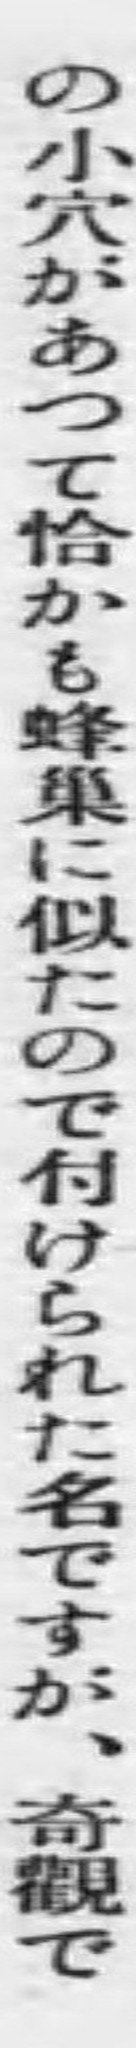の小穴があつて恰かも蜂巣に似たので付けられた名ですが、奇観で
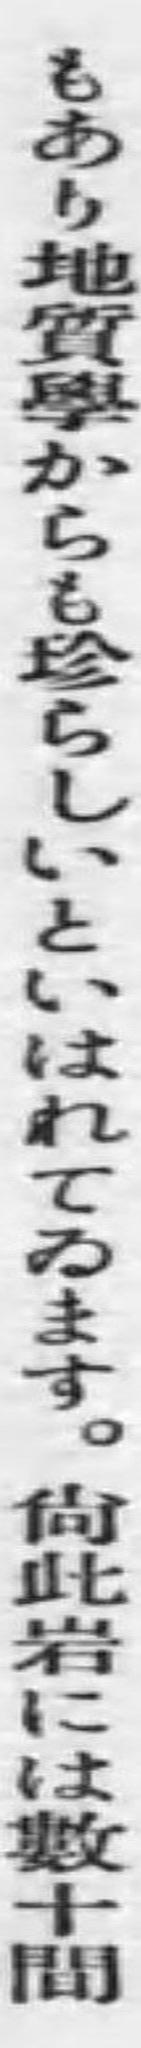もあり地質学からも珍らしいといはれてゐます。尚此岩には数十間
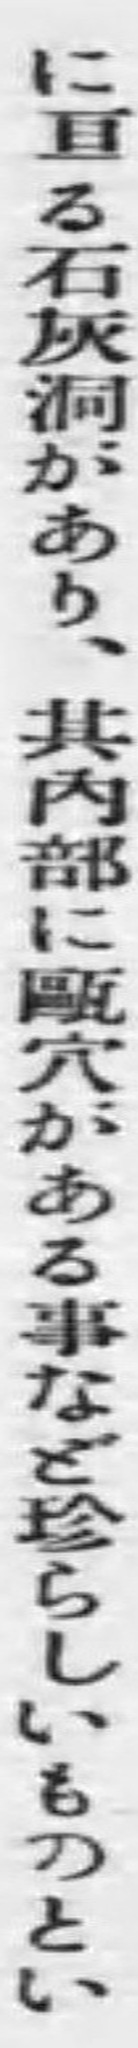に亘る石灰洞があり、其内部に甌穴がある事など珍らしいものとい
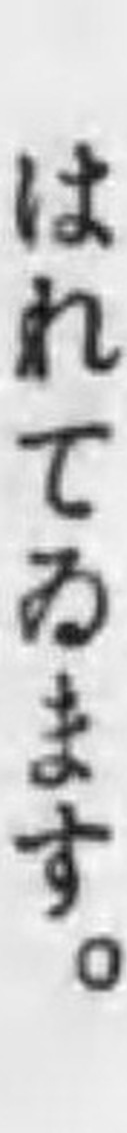はれてゐます。
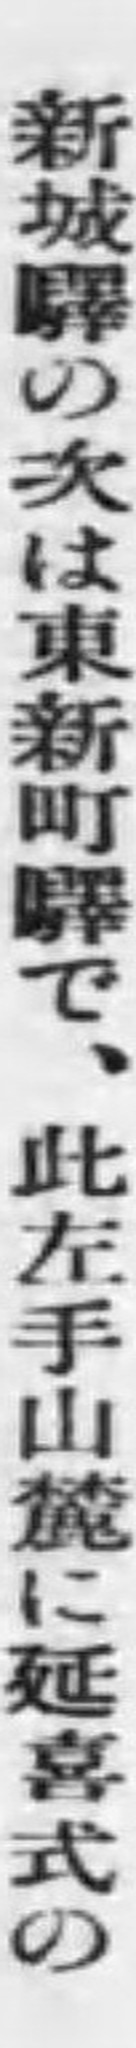新城駅の次は東新町駅で、此左手山麓に延喜式の
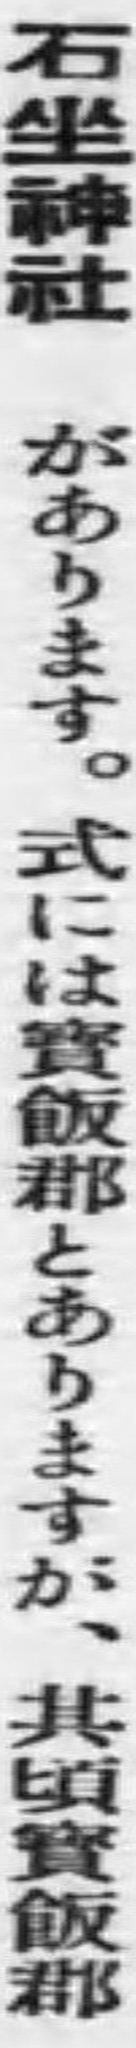石坐神社があります。式には宝飯郡とありますが、其頃宝飯郡
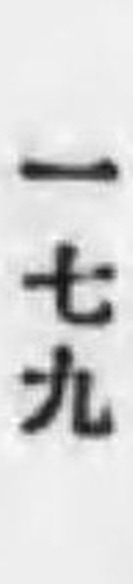一七九

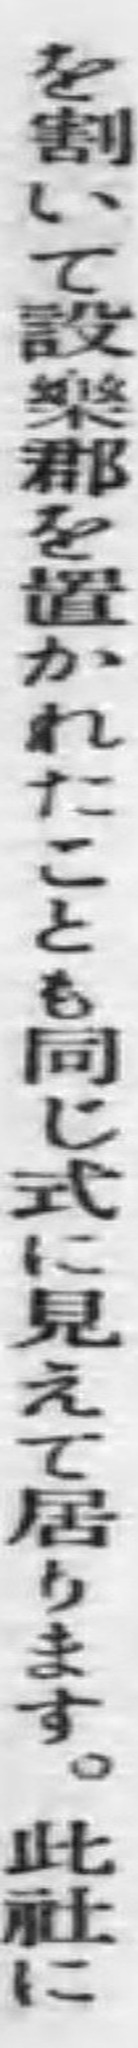を割いて設樂郡を置かれたことも同じ式に見えて居ります。此社に
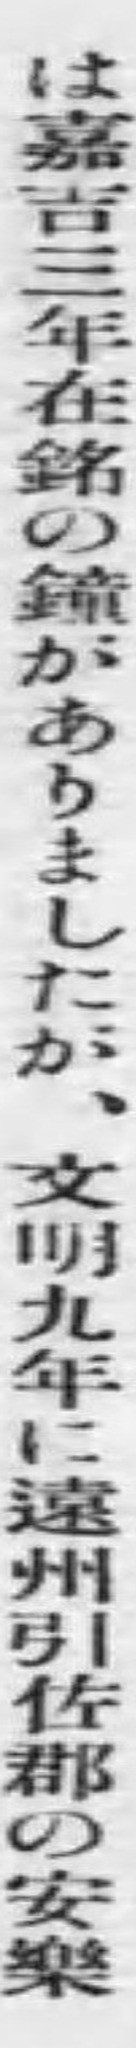は嘉吉三年在銘の鐘がありましたが、文明九年に遠州引佐郡の安樂
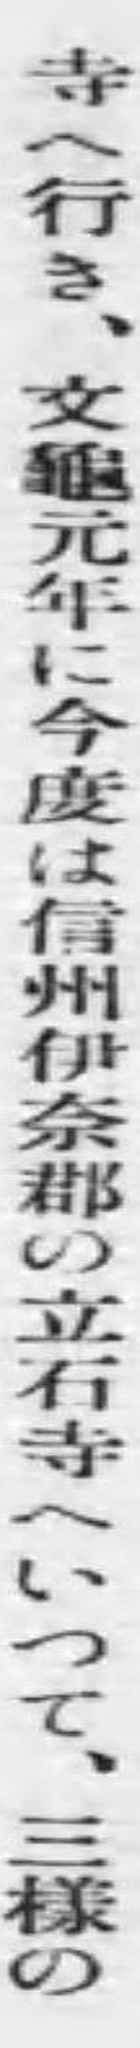寺へ行き、文龜元年に今度は信州伊奈郡の立石寺へいつて、三様の
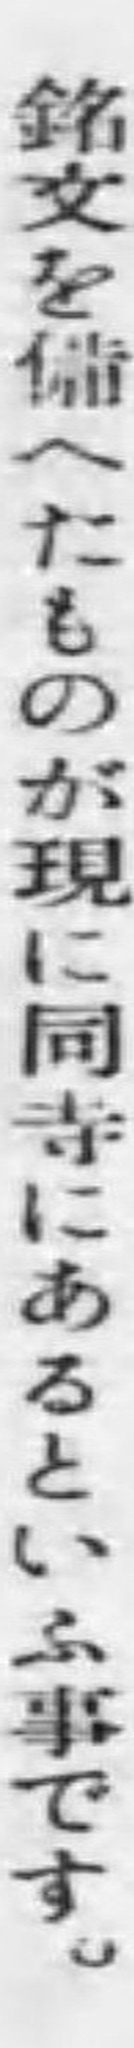銘文を備へたものが現に同寺にあるといふ事です。
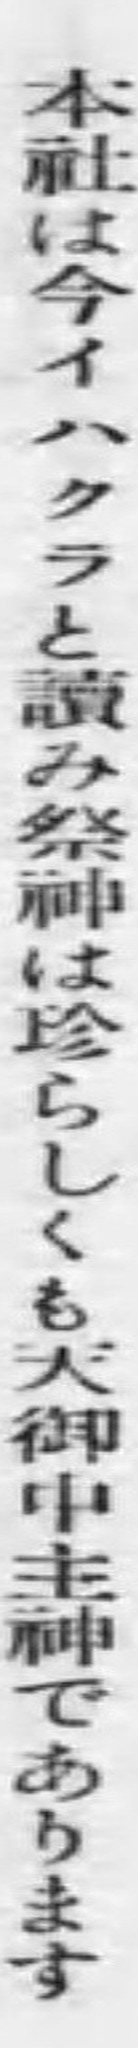本社は今イハクラと讀み祭神は珍らしくも天御中主神であります
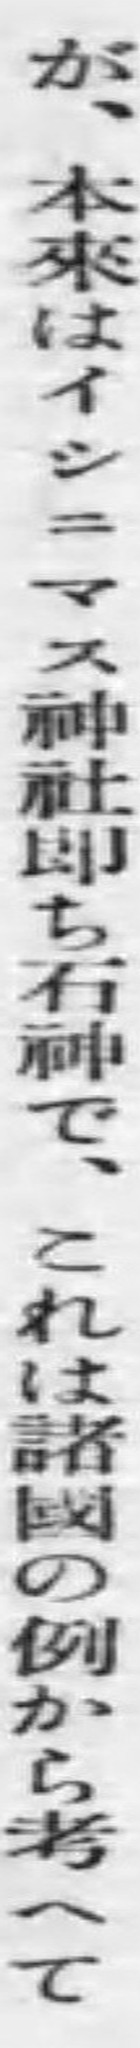が、本來はイシニマス神社即ち石神で、これは諸國の例から考へて
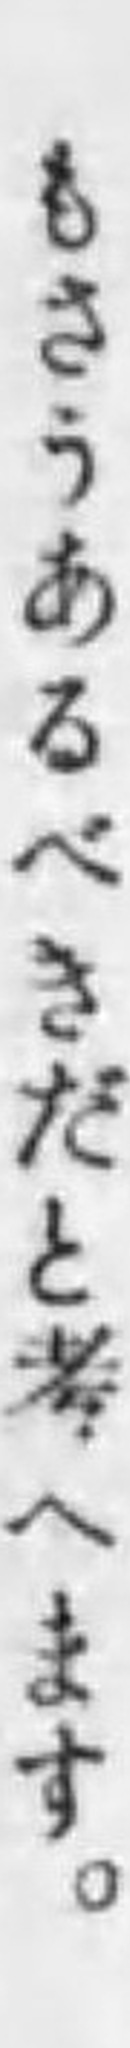もさうあるべきだと考へます。
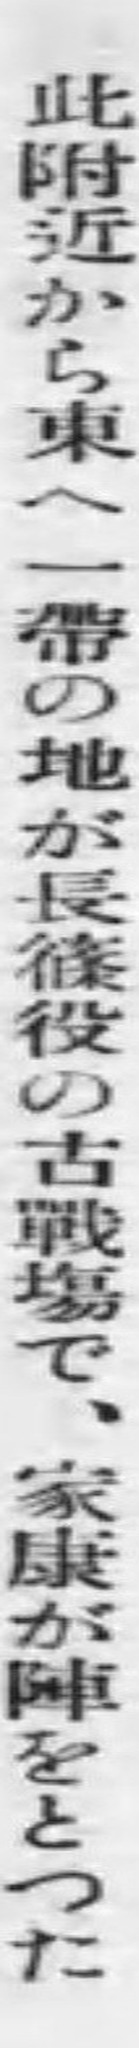此附近から東へ一帯の地が長篠役の古戦場で、家康が陣をとつた
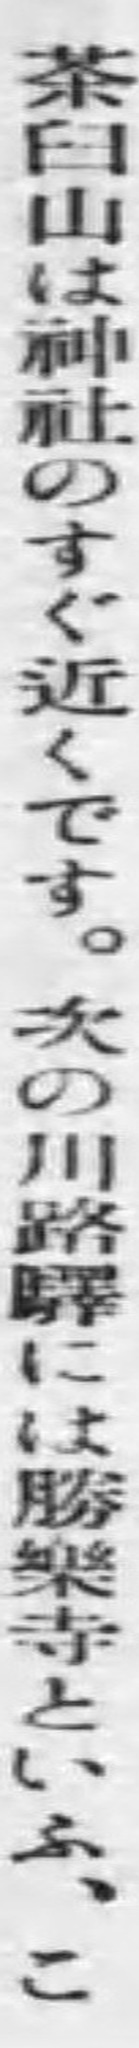茶臼山は神社のすぐ近くです。次の川路驛には勝樂寺といふ、こ
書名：東三河道中記 : 豊橋市及其附近案内
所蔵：国立国会図書館 National Diet Library, JAPAN
